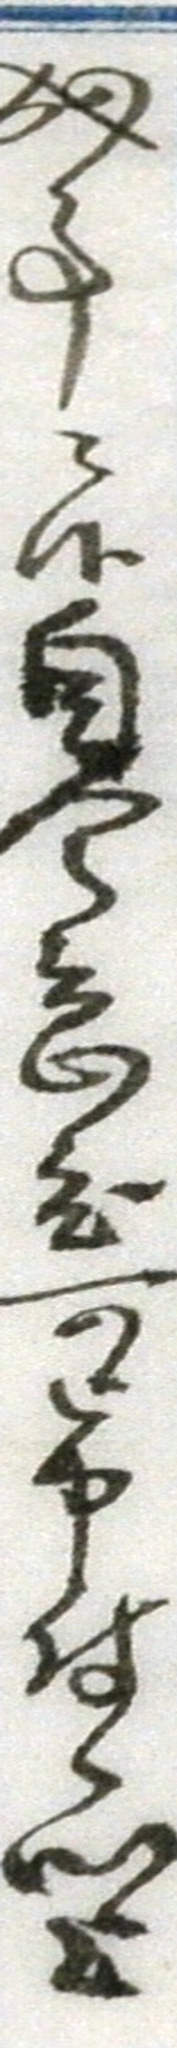成事ニ候自今急度可被申付候以上
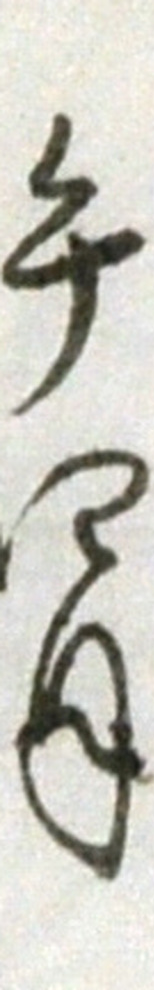午四月
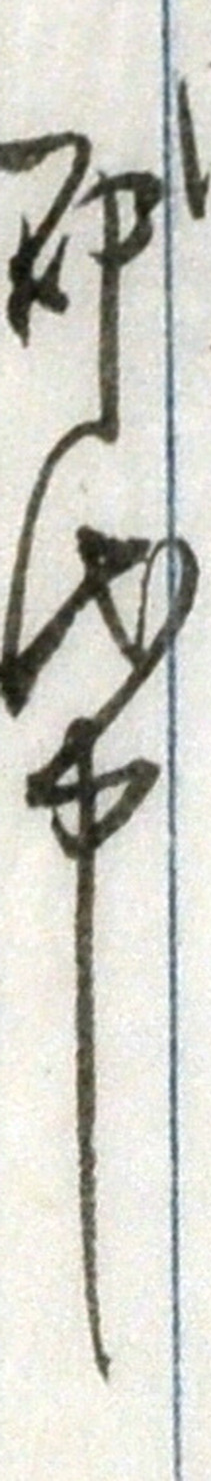郡代中

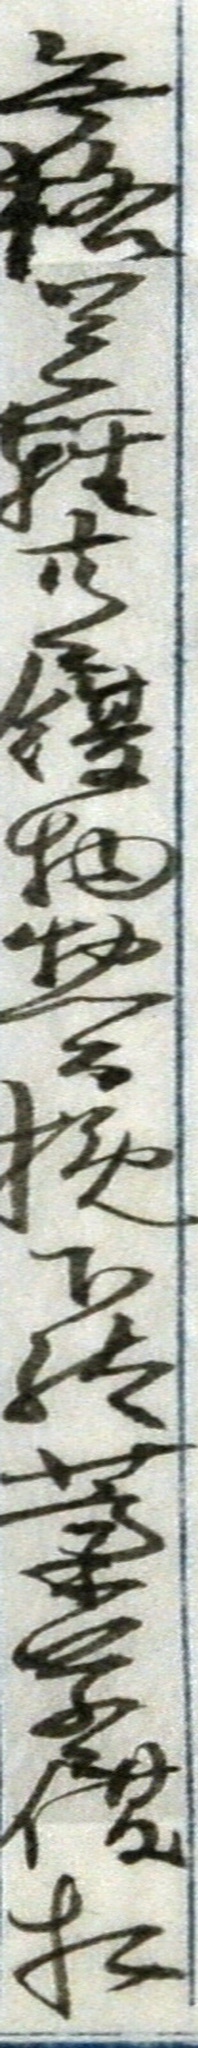無格足軽共履物惣而被挽下駄藁草履相
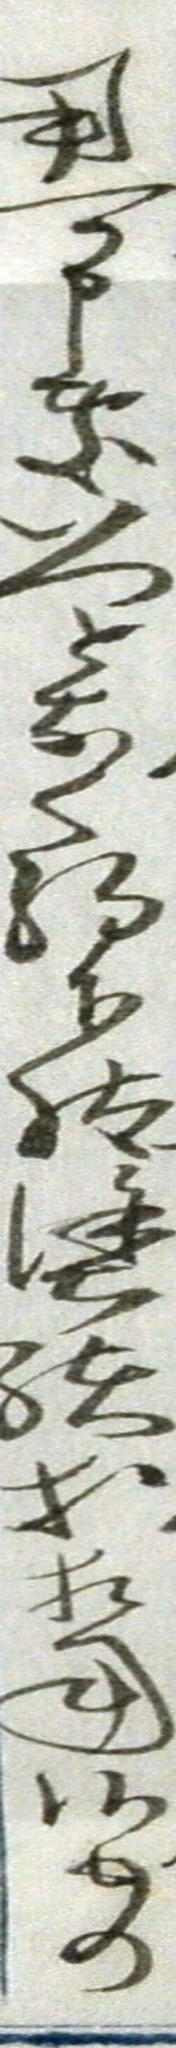用可申処いつとなく駒下駄ニ堅緒等相用候もの
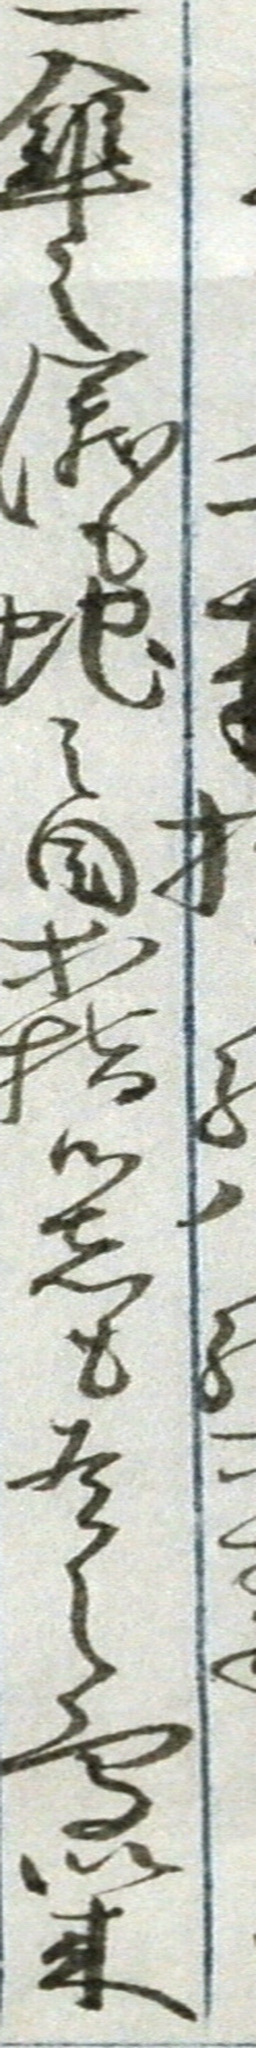一傘之儀も蛇之目等指候者も有之候間以来
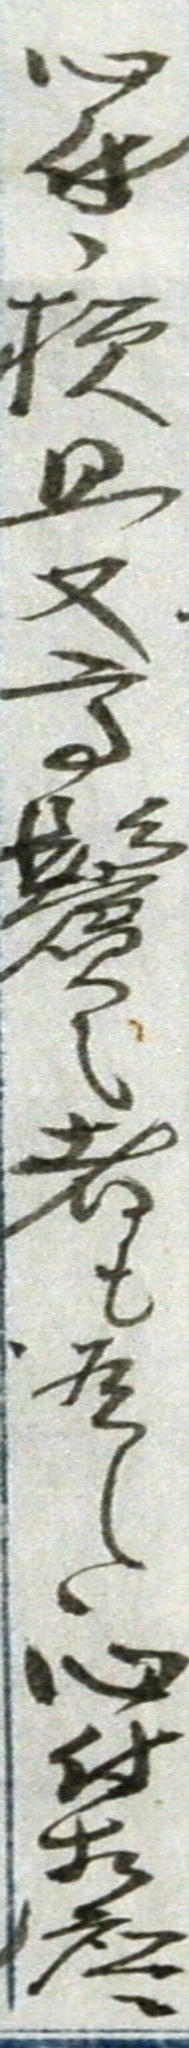心付候様且又高鬢之者も有之候心付相応ニ
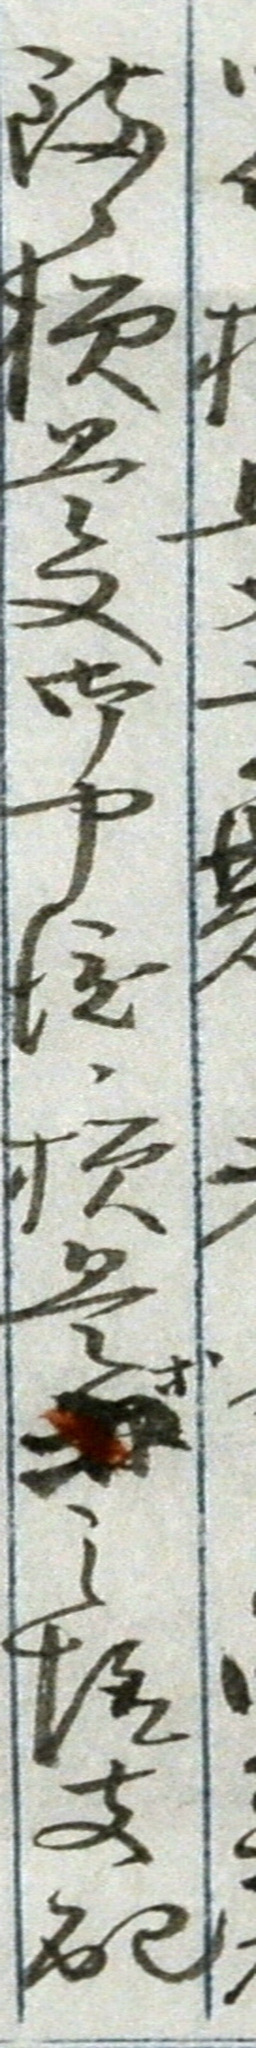致候様是又御申渡候様是等之趣支配
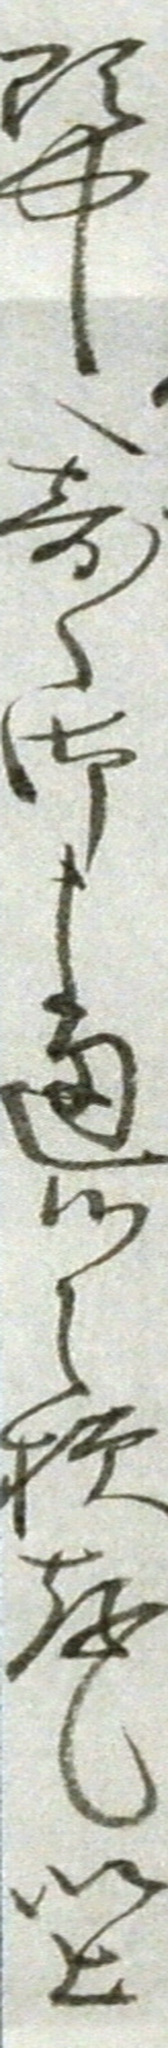頭中へ寄候御申通候之様存候以上
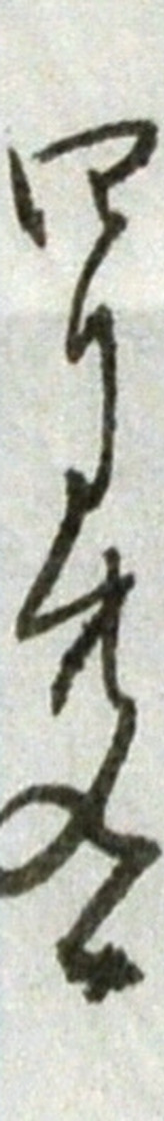四月廿九日
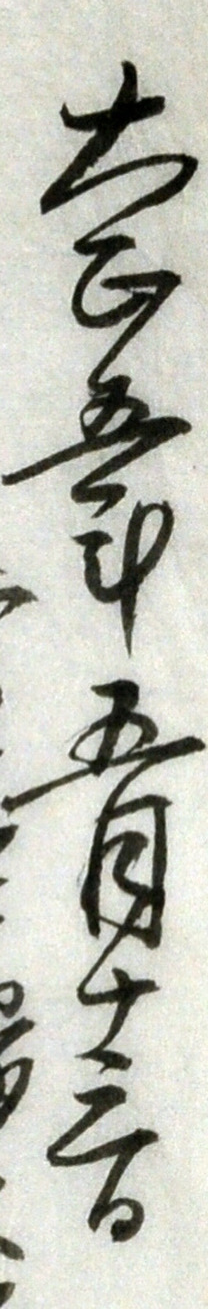大正五年五月十三日
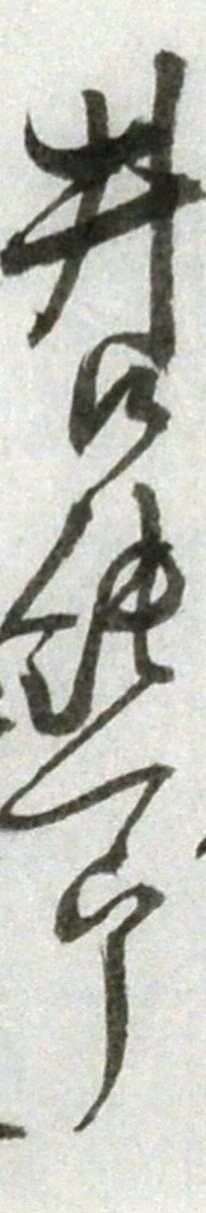井口純一郎
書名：長好公御代被仰出御書付（写）
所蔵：伊那市立高遠町図書館・合同会社AMANE
